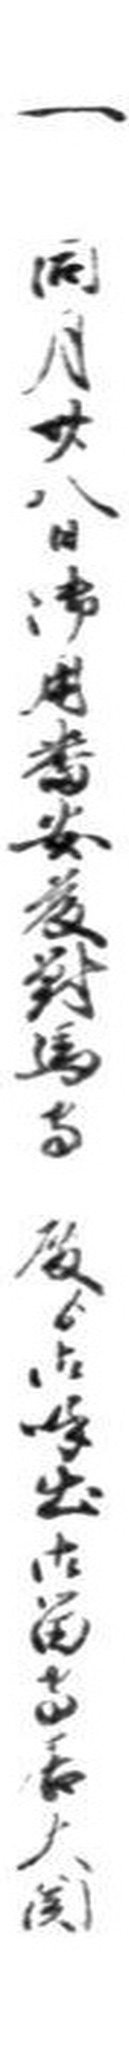一同月廿八日御用番安藤対馬守殿ゟ御呼出御留守居大関
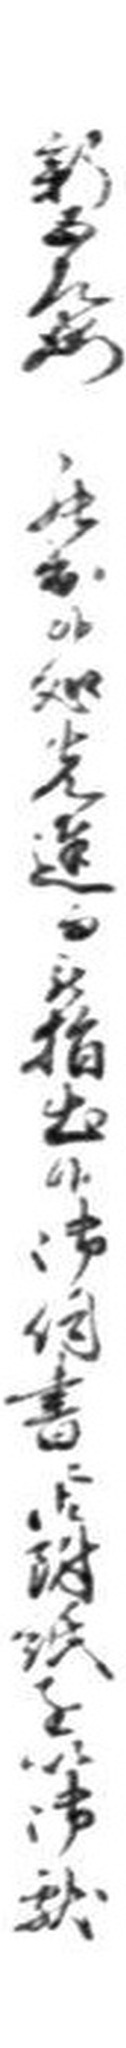新五左衛門罷出候処先達而被指出候御伺書ニ御附紙を以御献
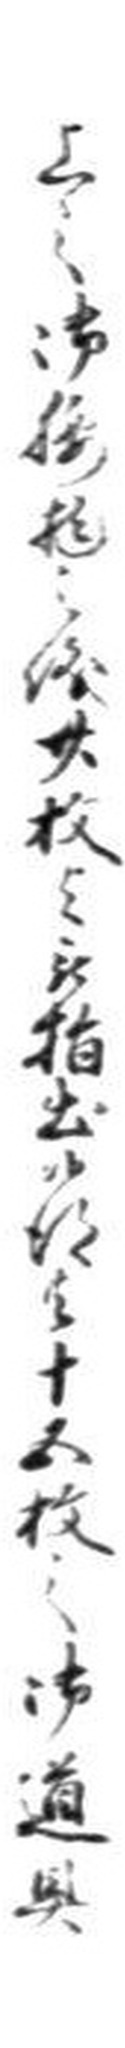上之御腰之儀廿枚与被指出候得共十五枚之御道具
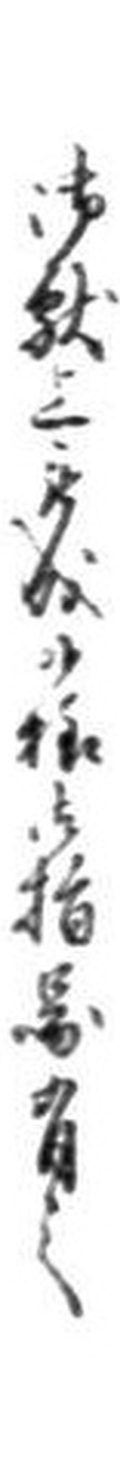御献上被成候様御指図有之
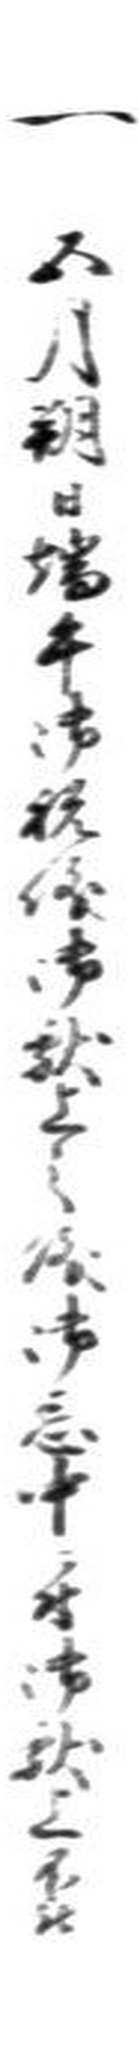一五月朔日端午御祝儀御献上之儀御忌中ニ付御献上不被
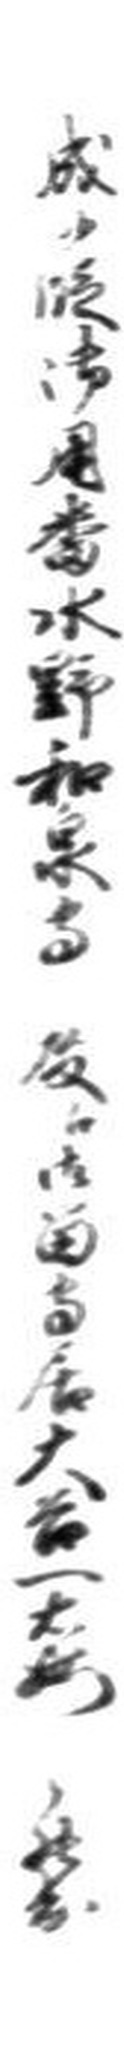成候段御用番水野和泉守殿江御留守居大谷一右衛門罷出
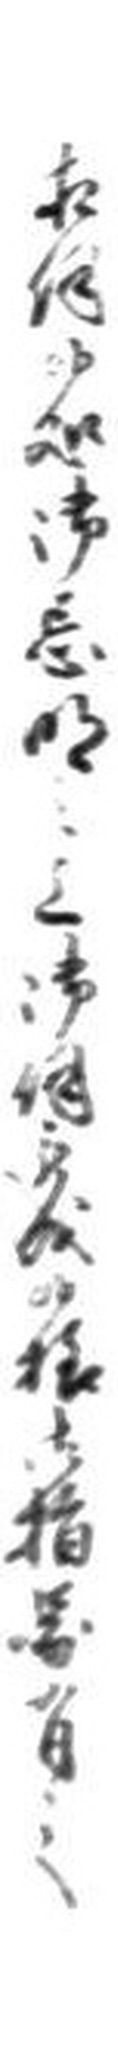相伺候処御忌明之上御伺被成候様御指図有之
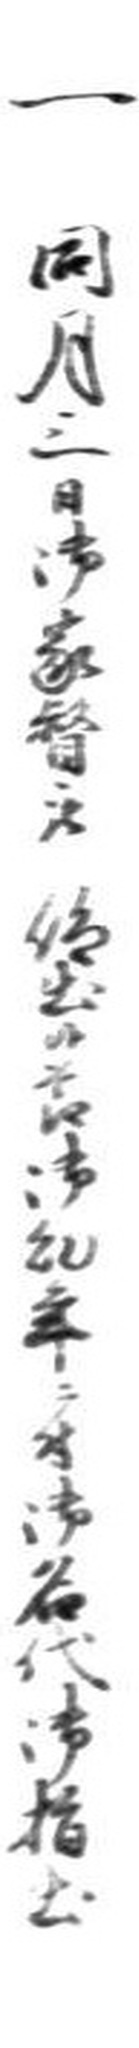一同月三日御家督被仰出候節御幼年ニ付御名代御指出
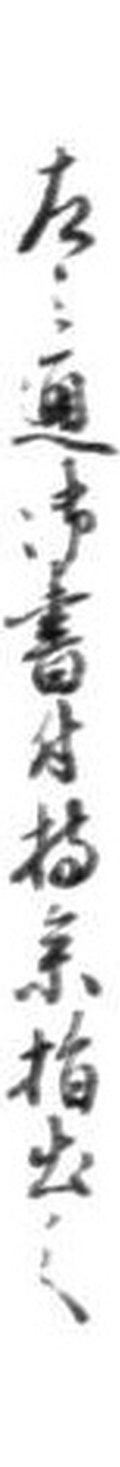左之通御書付持参指出之
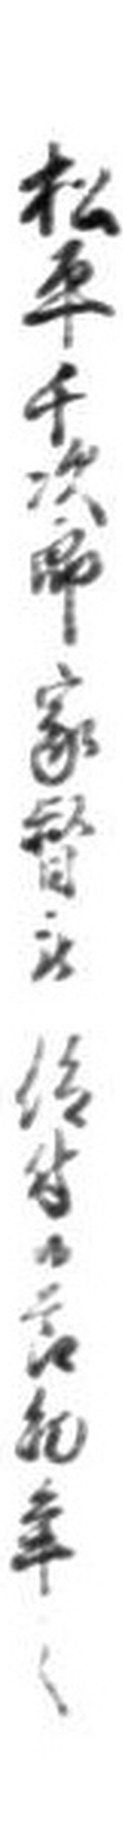松平千次郎家督被仰付候節幼年之
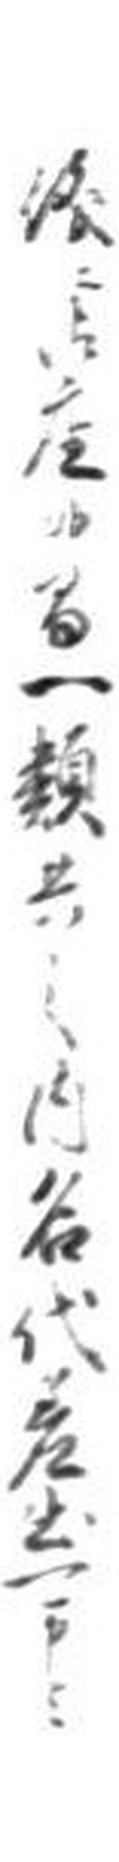儀ニ御座候間一類共之内名代差出可申与

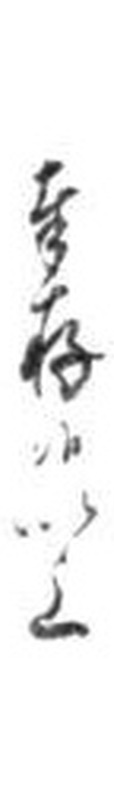奉存候以上
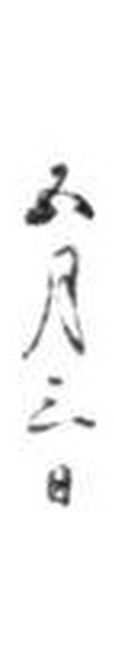五月三日
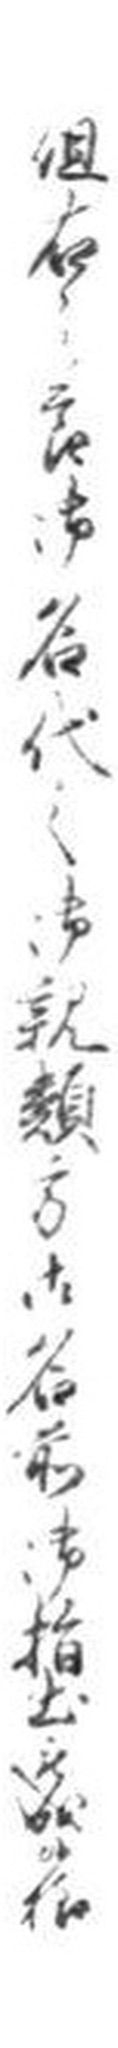但右之節御名代之御親類方御名前御指出被成候様
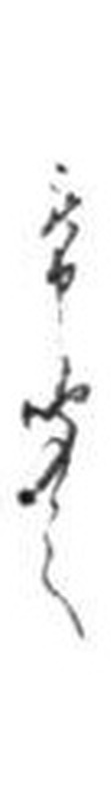被申聞之
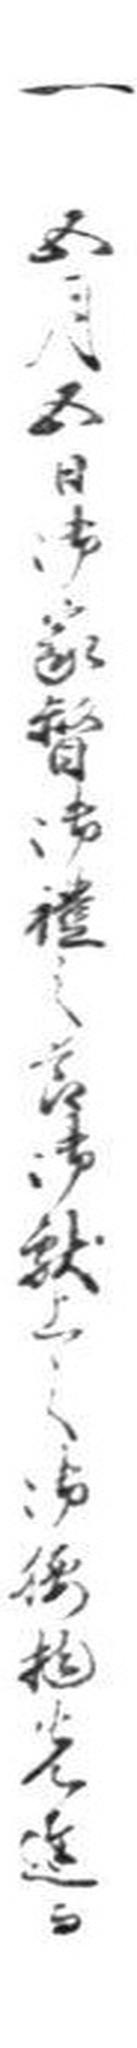一五月五日御家督御礼之節御献上之御腰物先達而
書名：家譜 三十七 宗矩公 従正徳五年到享保九年五月
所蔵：福井県文書館 Fukui Prefectural Archives
